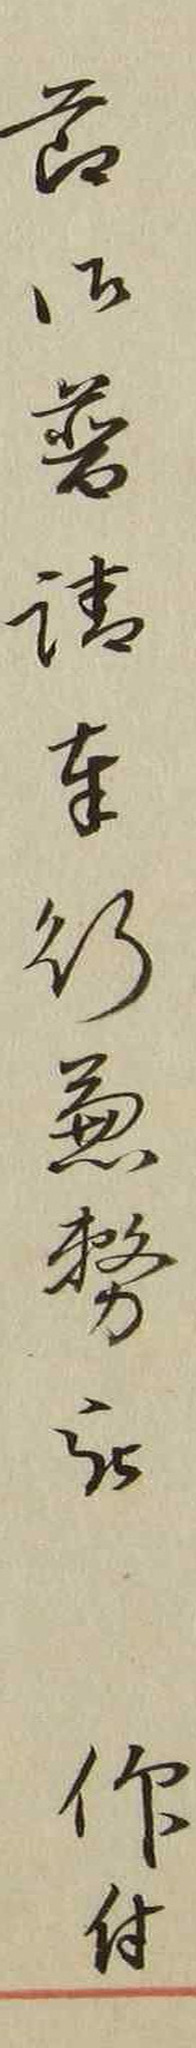節御普請奉行兼務被仰付
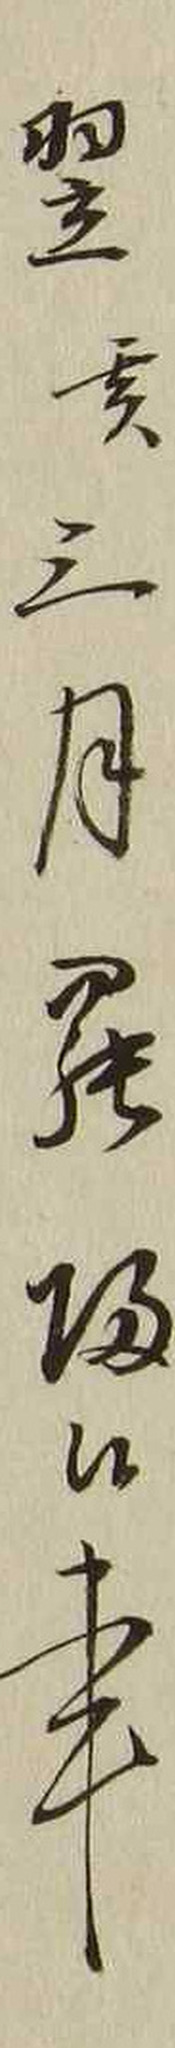翌亥三月罷帰候事
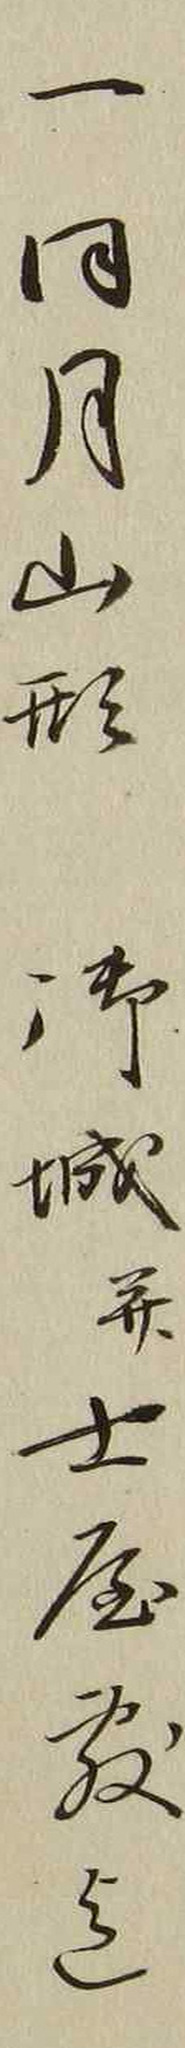一同月山形御城并士屋敷迄
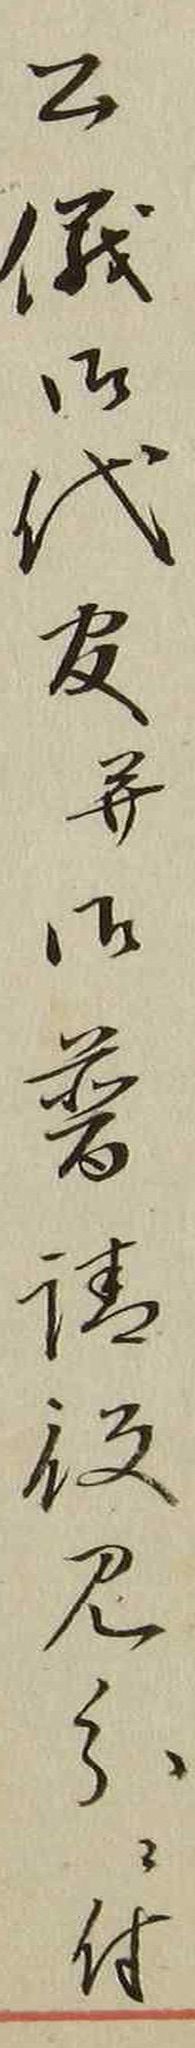公儀御代官并御普請役見分ニ付
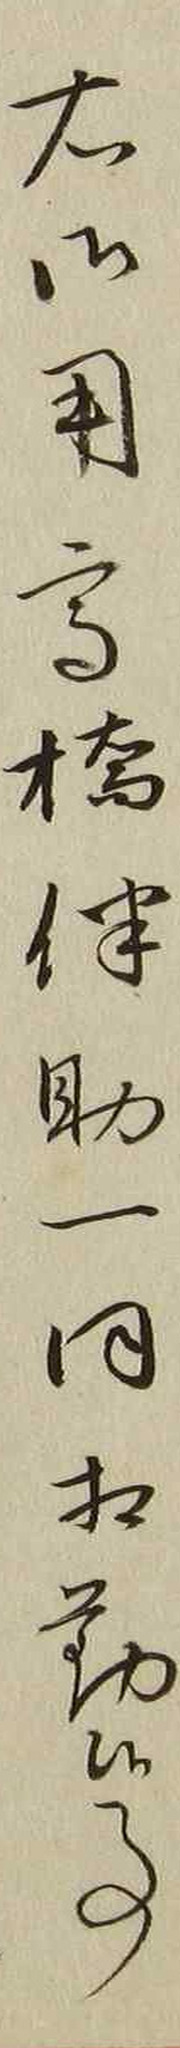右御用高橋伴助一同相勤候事
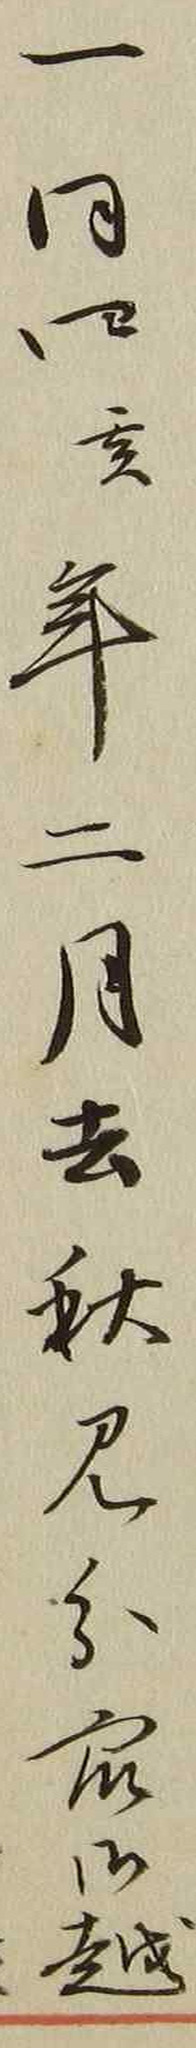一同四亥年二月去秋見分衆御越
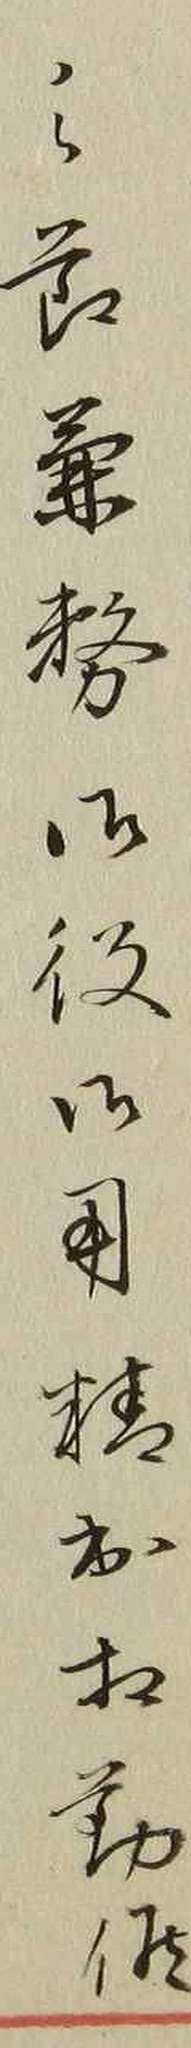之節兼務御役御用精出相勤候
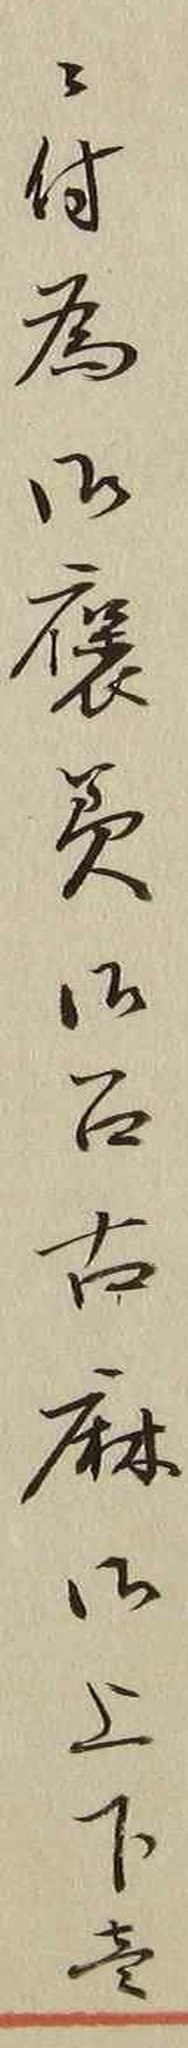ニ付為御褒美御召右麻御上下壱
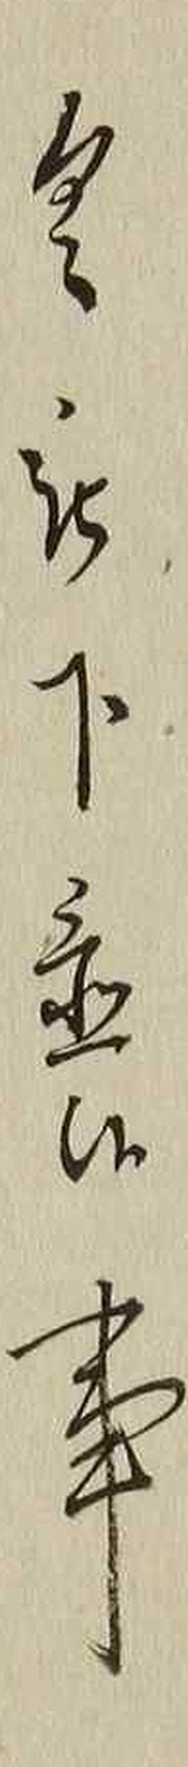具被下置候事
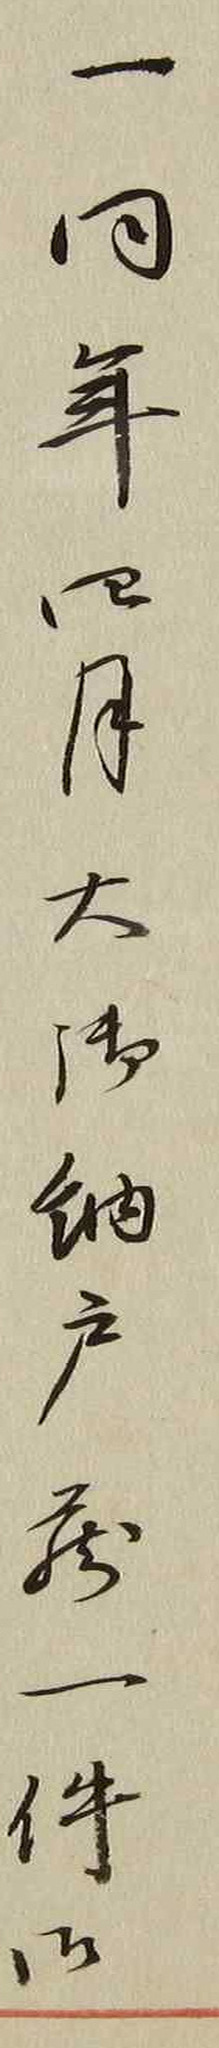一同年四月大御納戸蔵一件御
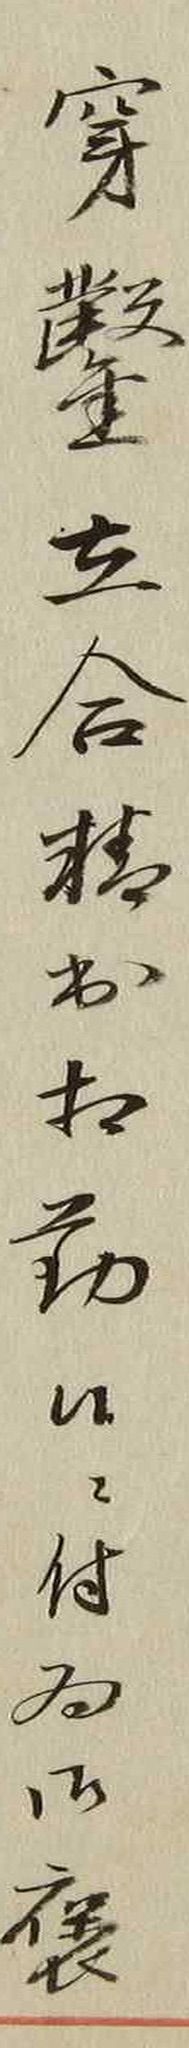穿鑿立合精出相勤候ニ付為御褒
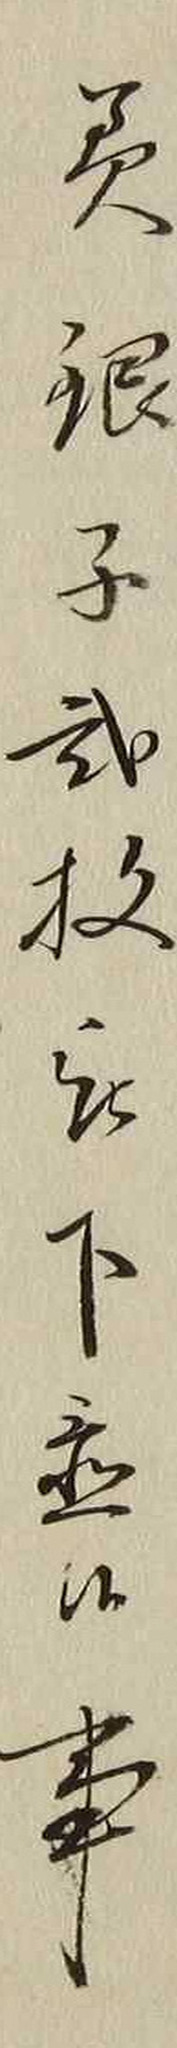美銀子弐枚被下置候事
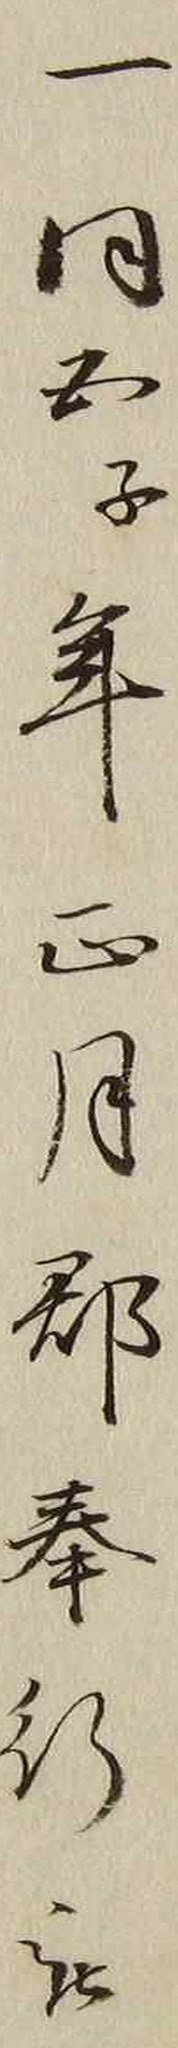一同五子年正月郡奉行被
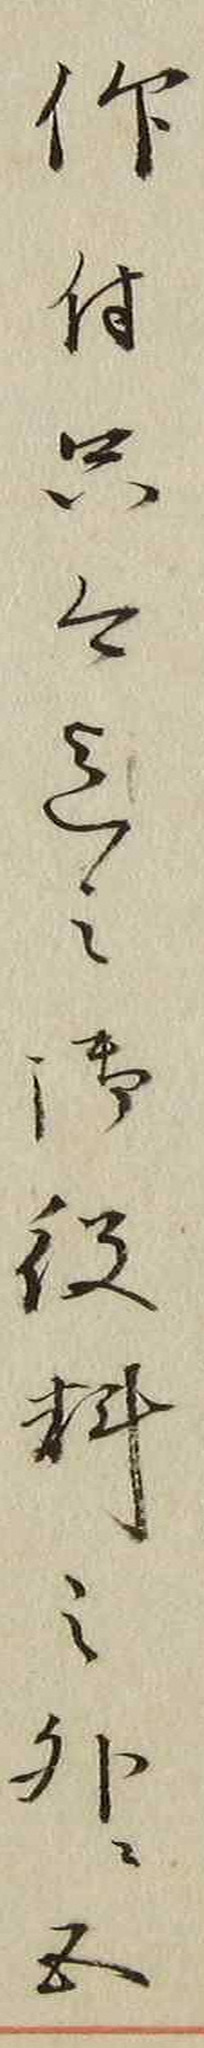仰付只今迄之御役料之外ニ五
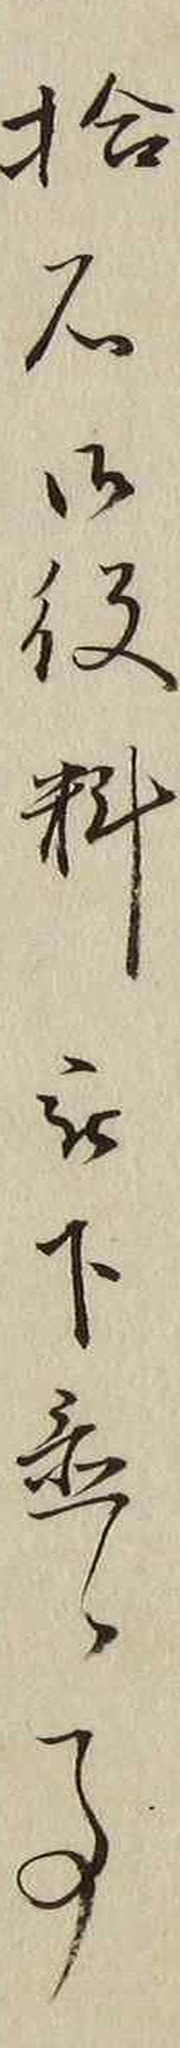拾石御役料被下置候事
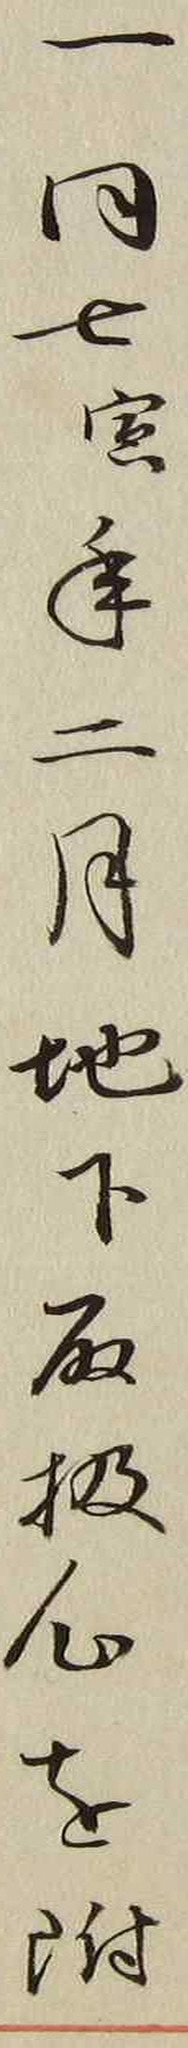一同七寅年二月地下取扱心を附
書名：諸士系譜　巻之22　い之部22
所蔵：会津若松市立会津図書館
